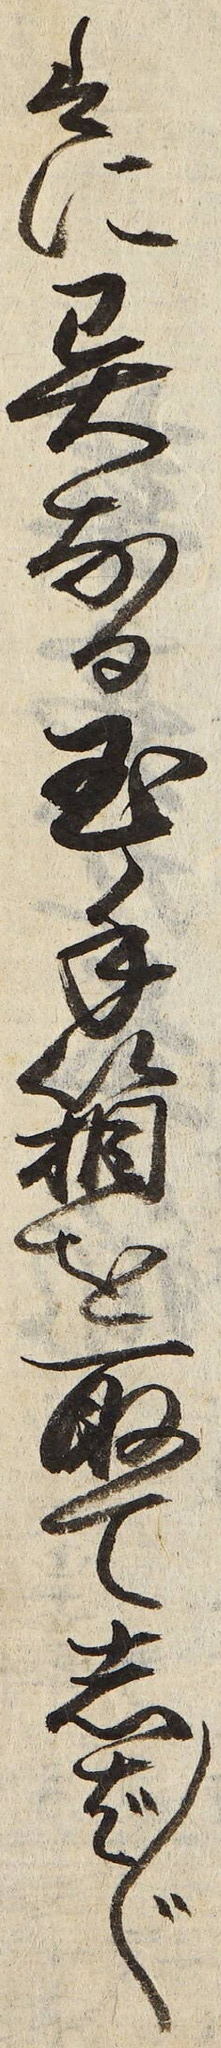はに異なる玉手箱を取てしば〴〵
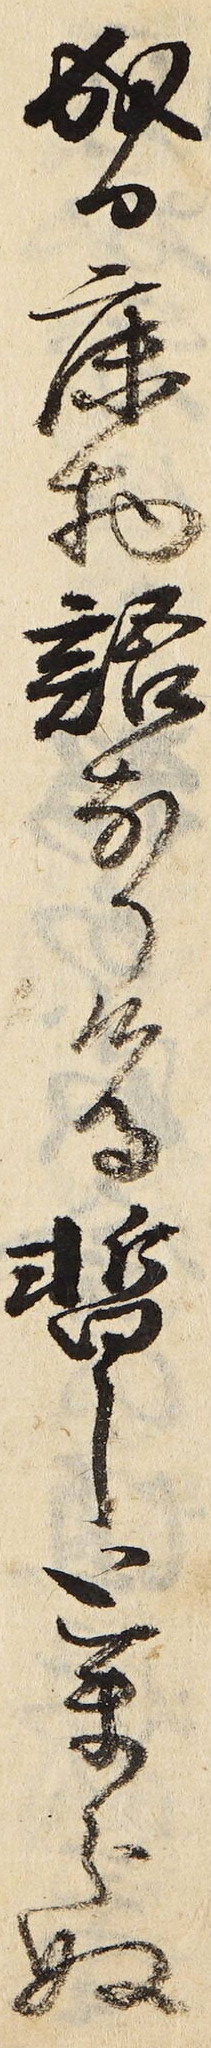成る寝物語なりける暫しとまらぬ
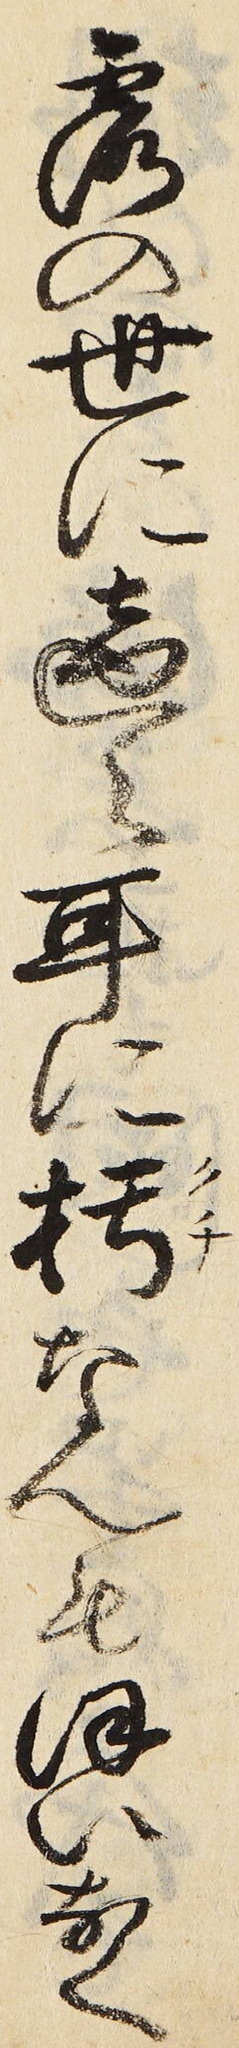露の世に適々耳に朽なんもほいなく
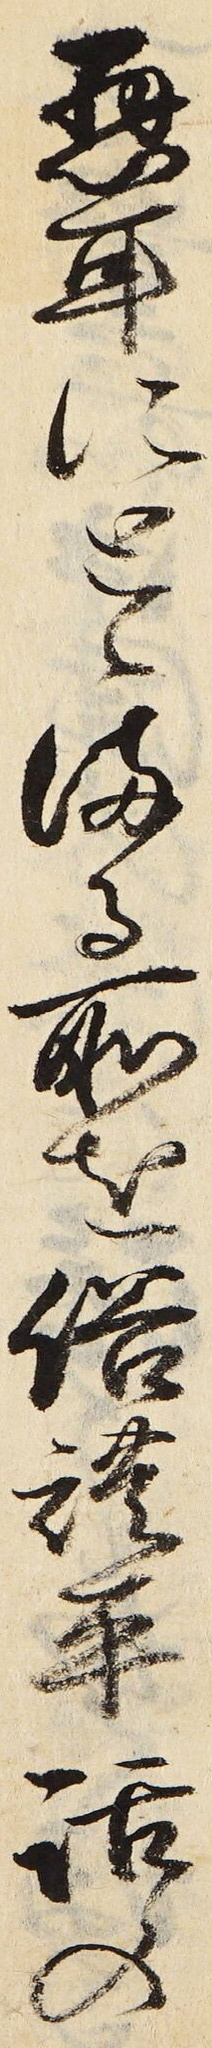惣耳にとゝまる所を俗談平話の
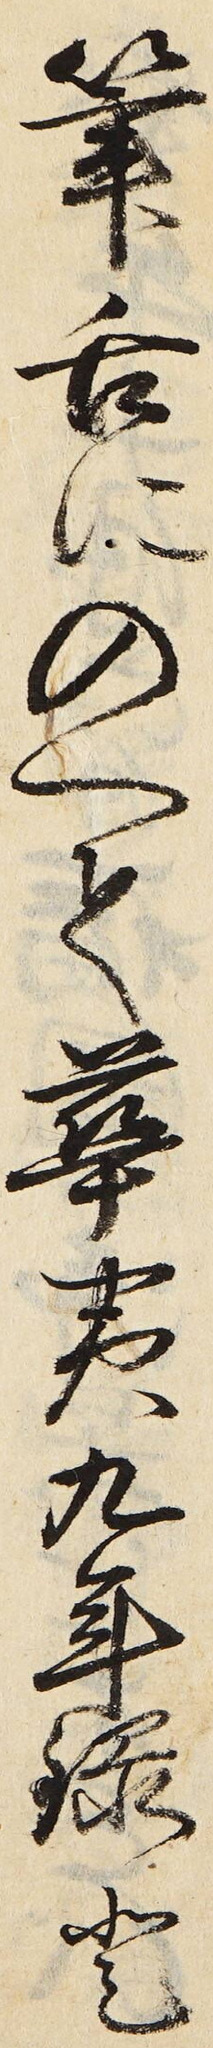筆舌にのへて華夷九年録と
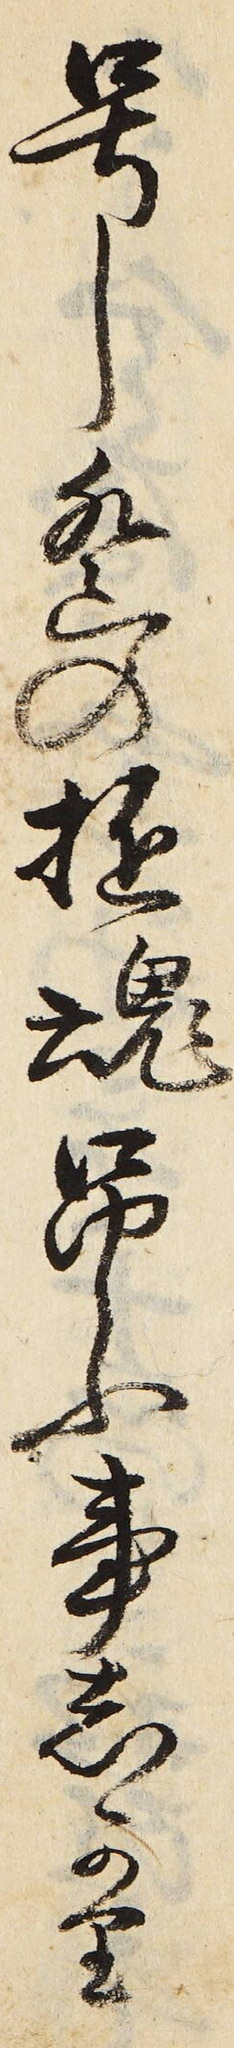号し遥の遊魂吊ふ事しかり
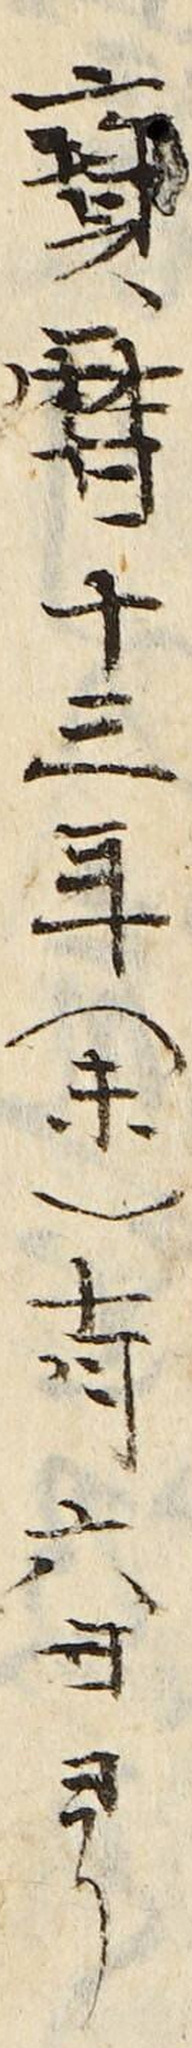宝暦十三年(未)十月六日より

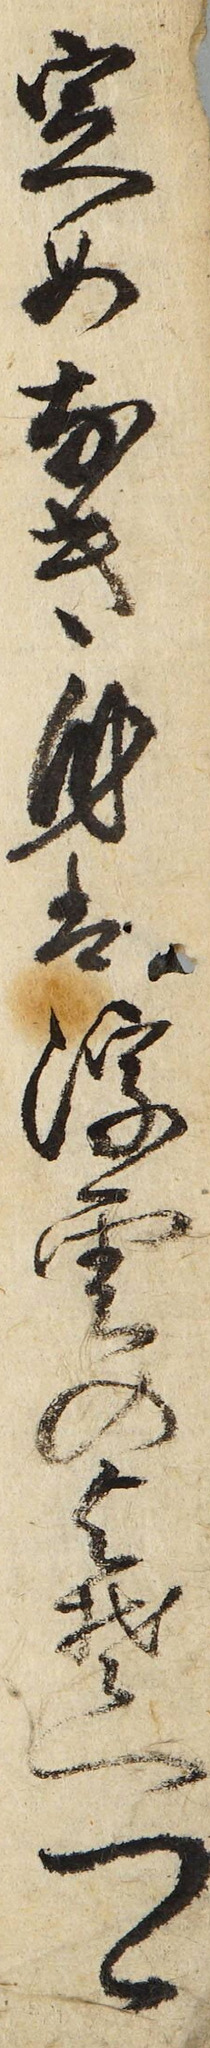定めなき身は浮雲のよそへつ
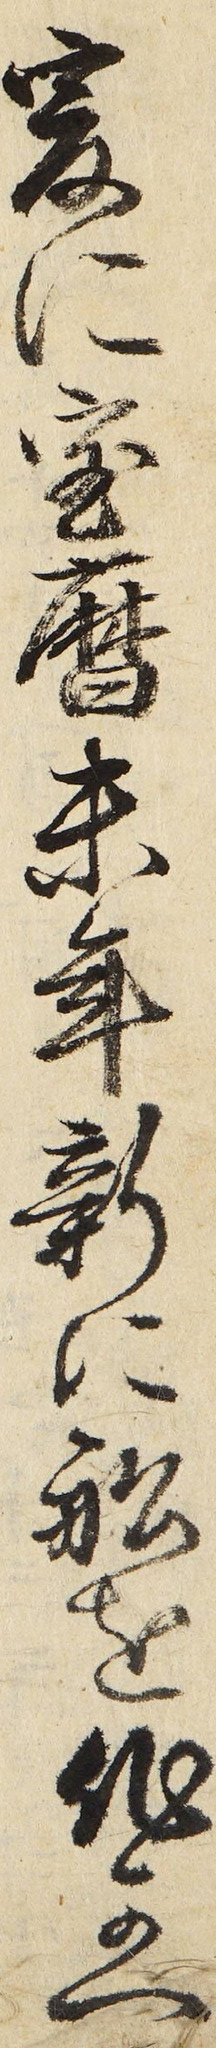爰に宝暦未年新に船を作かへ
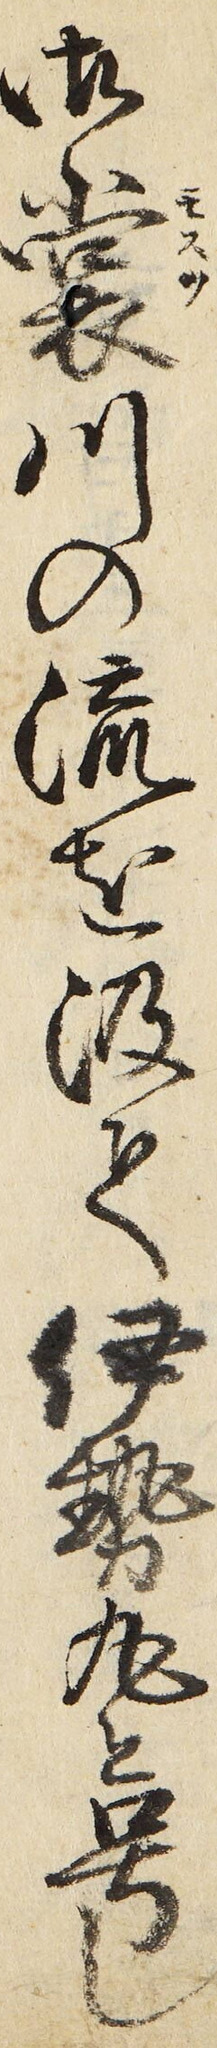御裳川の流を汲て伊勢丸と号し
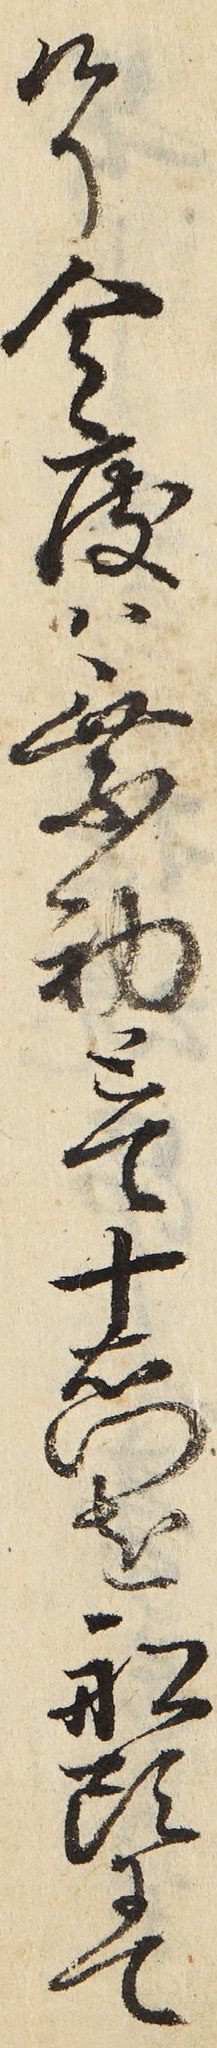けり今度は乗初とて十右門を船頭にて
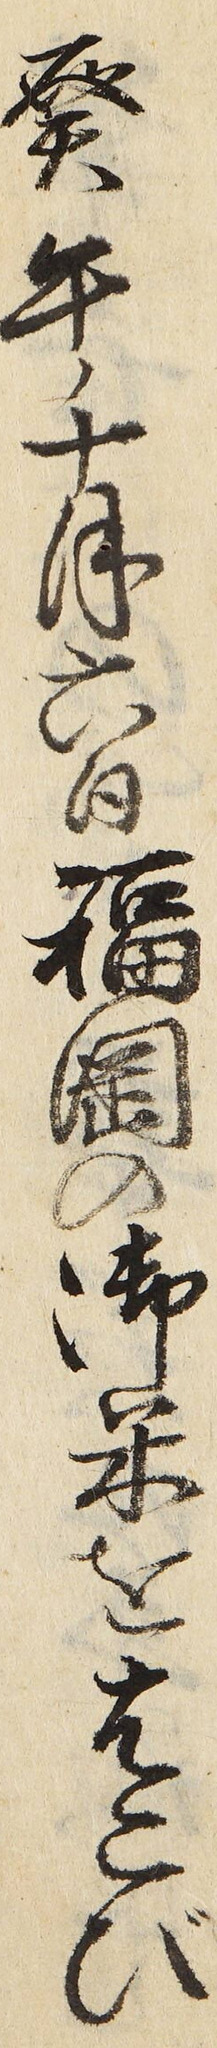癸午の十月六日福岡の御米をはこび
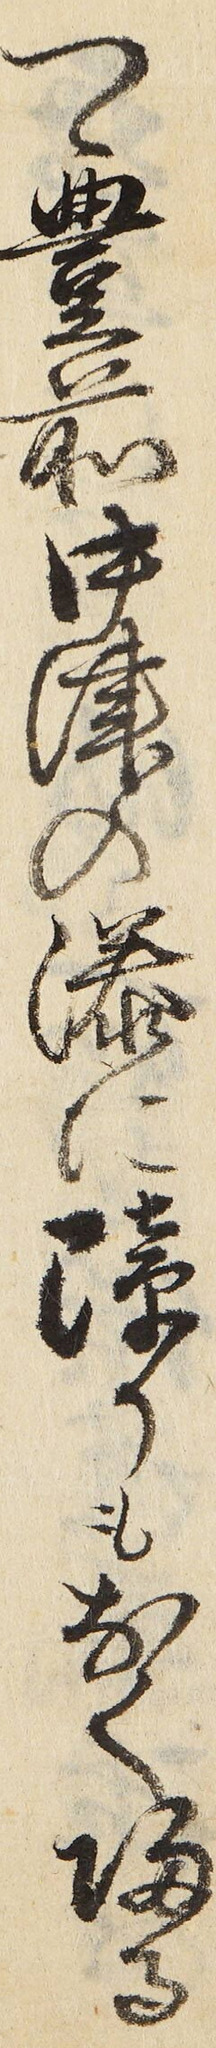つゝ豊前中津の湊に障りもなく帰る
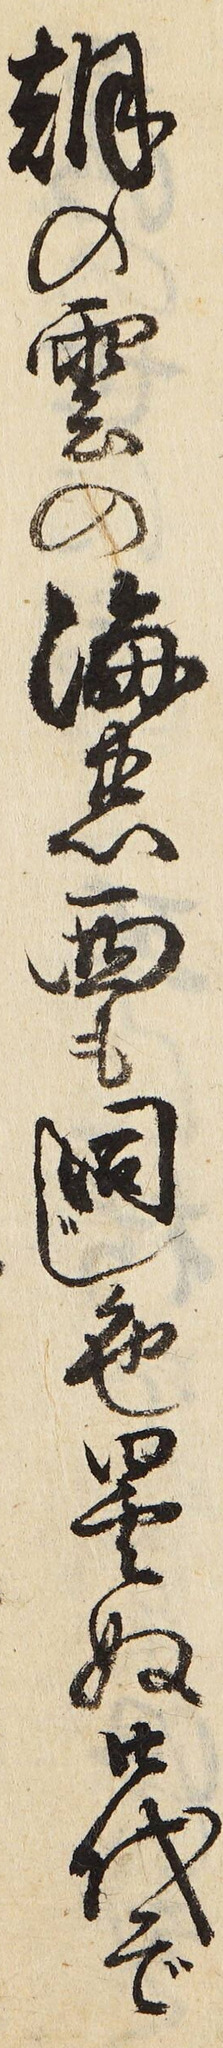朝の雲の海の西も同じ色曇ぬ御代ぞ
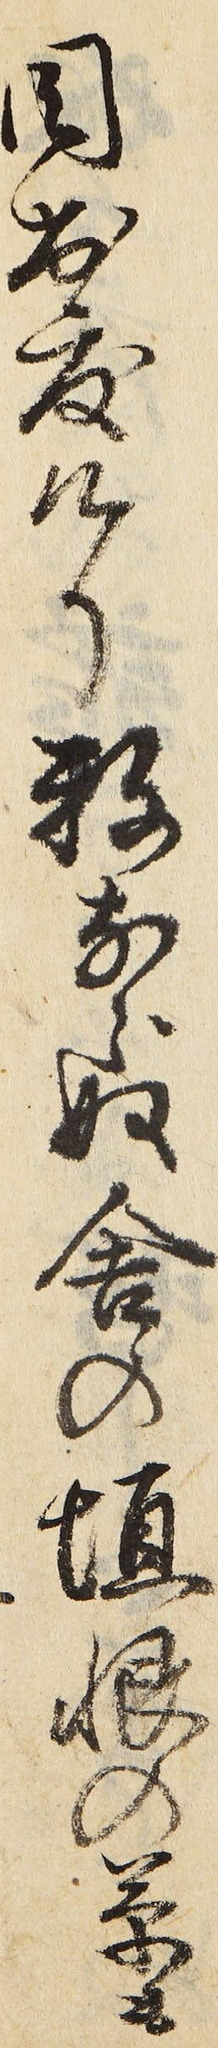目出度けり数ならぬ舎の垣根の草も
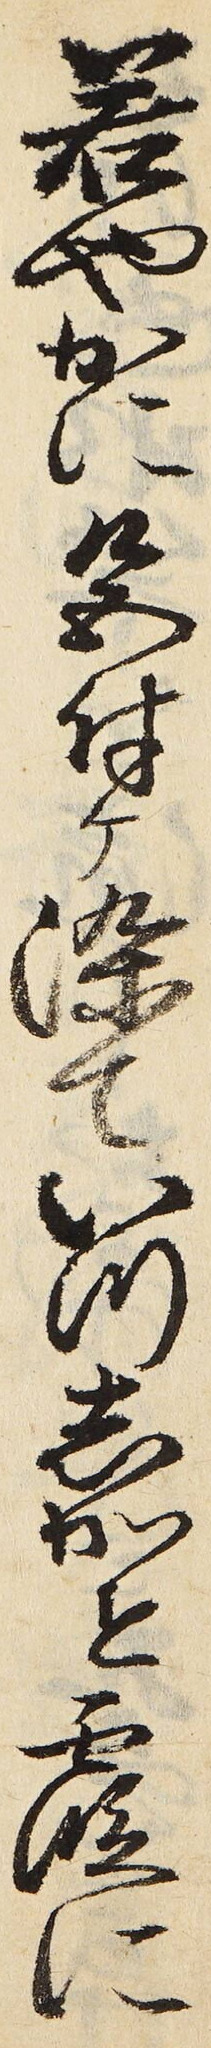若やかに色付け染ていつしかと霞に
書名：華夷九年録
